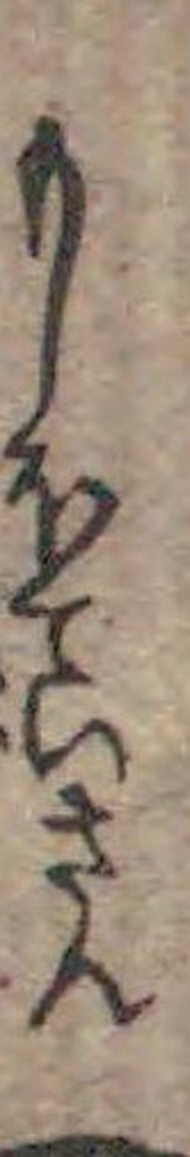もしほていさん
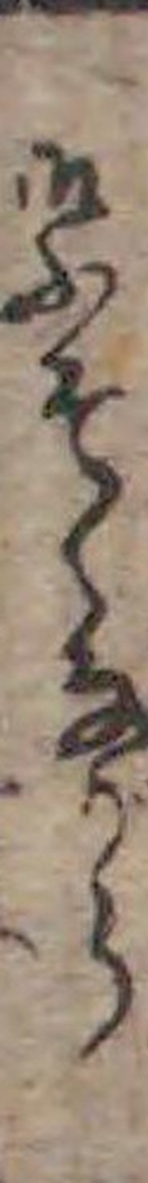御ふそくながら
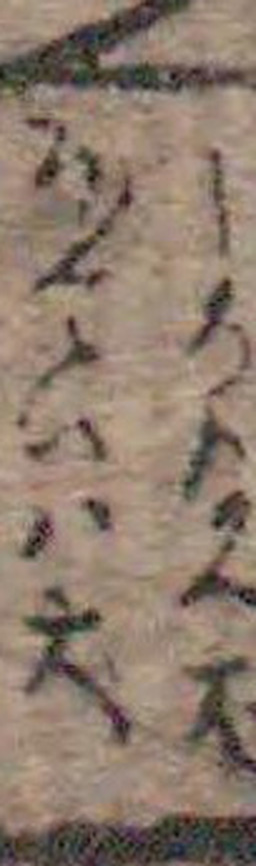ほていは大
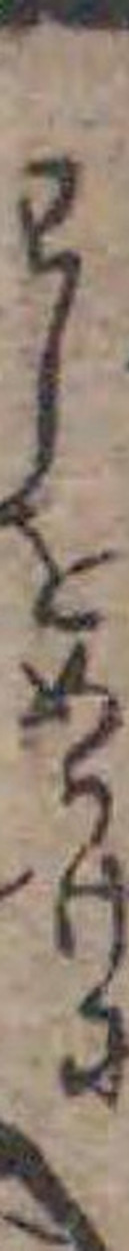わしをめかけに
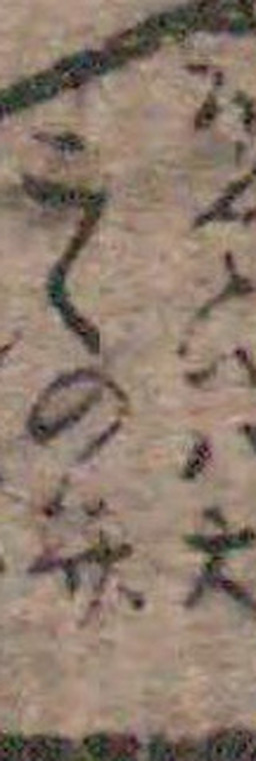こくの弁
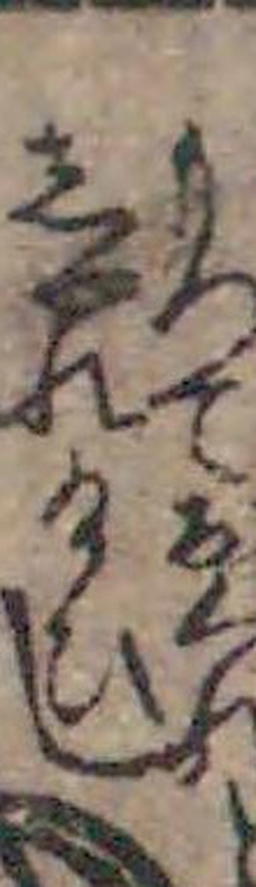しやれ給ひし
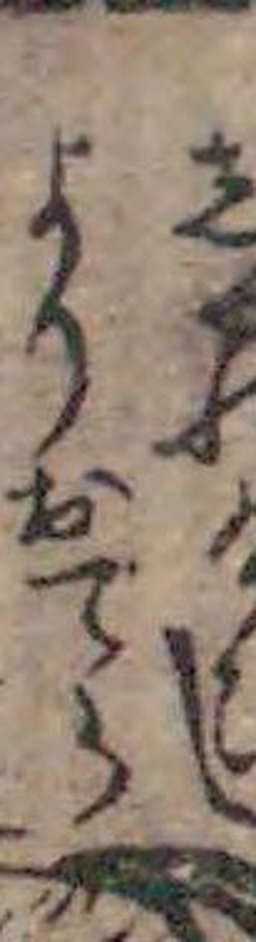よりおてら
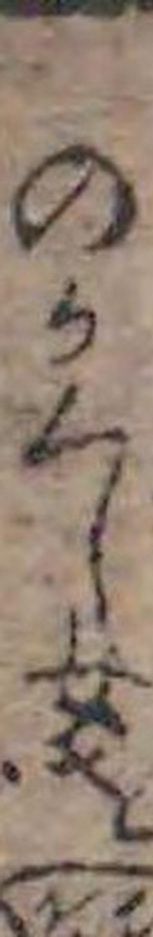のかくし女を
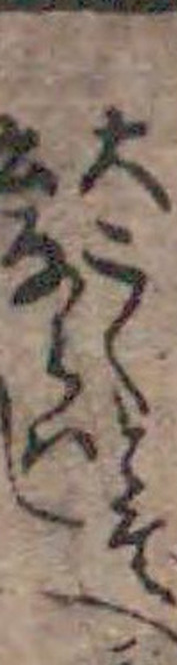云ならはし

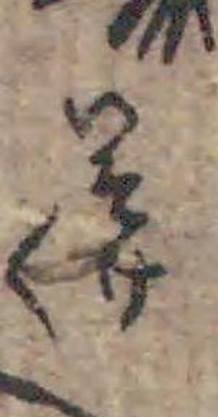いそけ
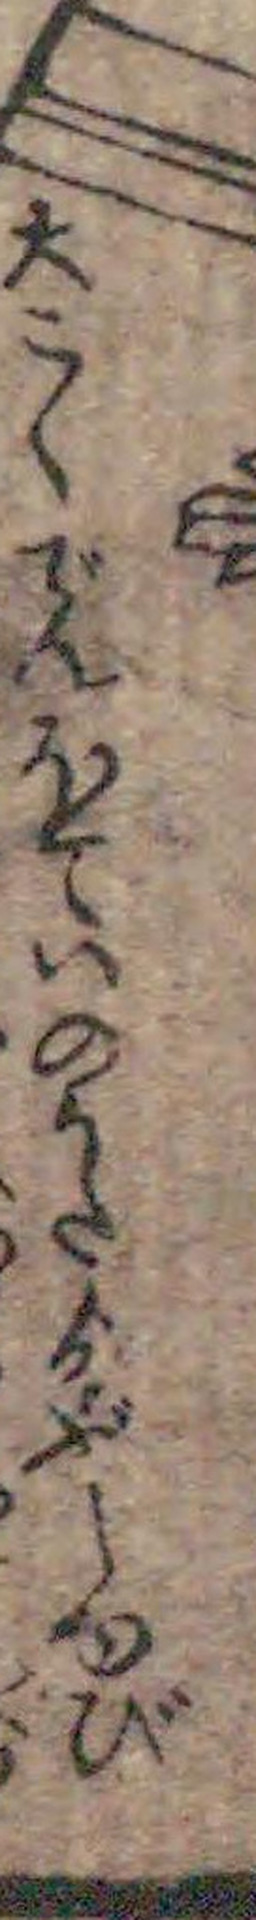大こくでんほていのかたよりぶしゆび
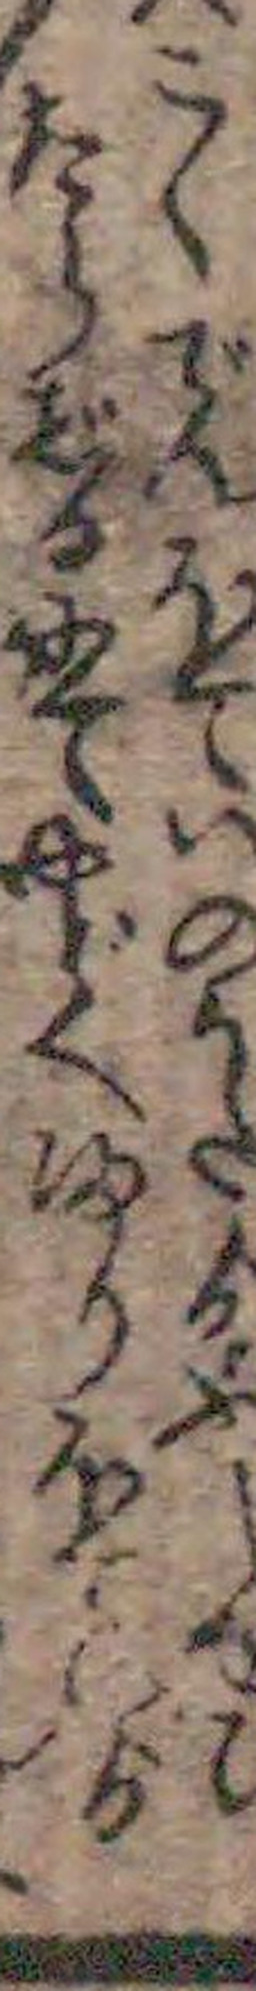たらじるにてやどへ帰りほていより
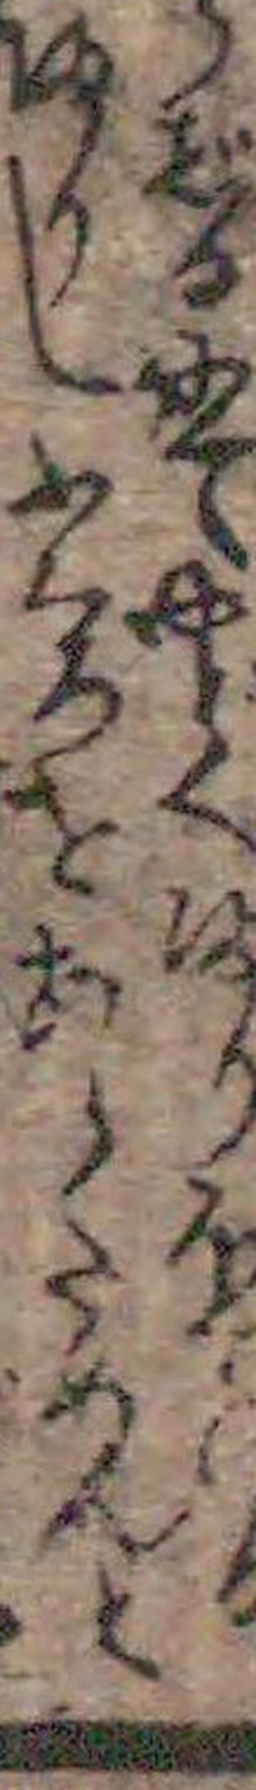帰りしふくろをあらためんと
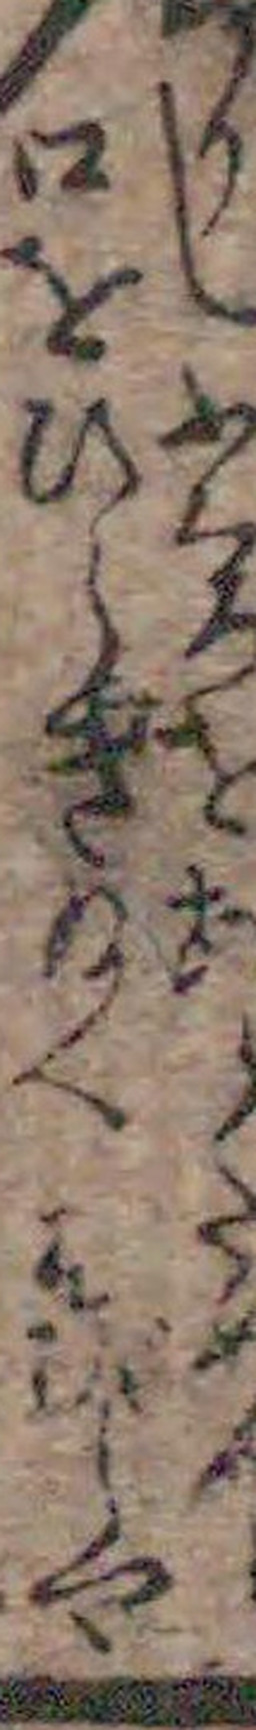口をひらき給へはびしや
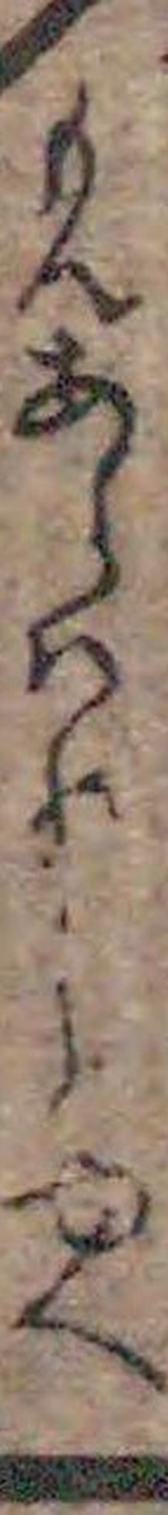もんあらはれしゆへ
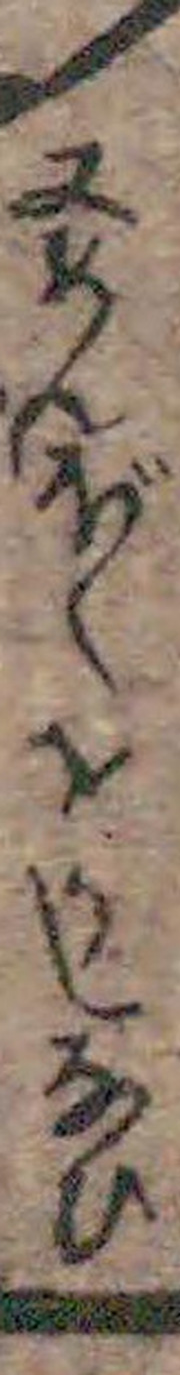又めんぼくをうしなひ
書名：蛭子大黒壮年過 : 2巻
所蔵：国立国会図書館 National Diet Library, JAPAN
